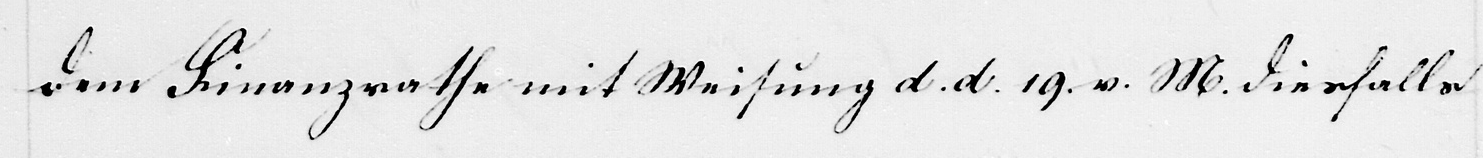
dem Finanzrathe mit Weisung d. d. 19. v. M. diesfalls
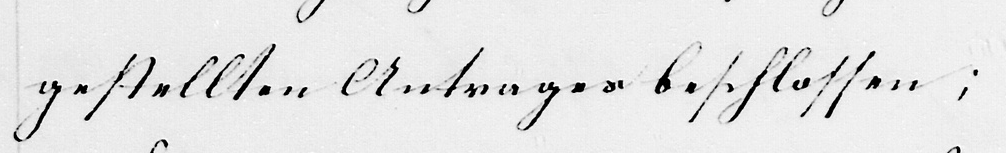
gestellten Antrages beschlossen;
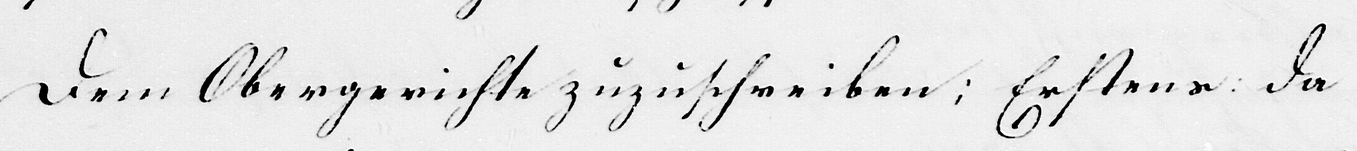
Dem Obergerichte zuzuschreiben; Erstens: da
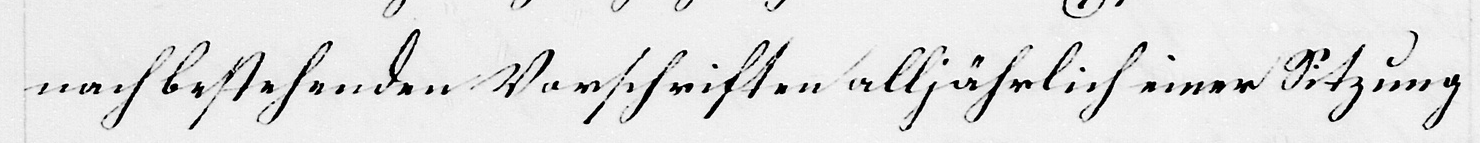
nach bestehenden Vorschriften alljährlich einer Sitzung
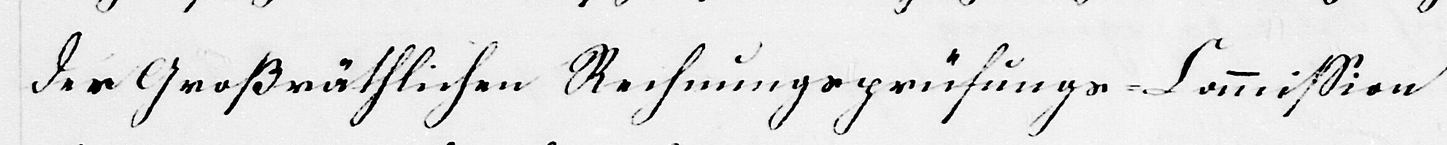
der Großräthlichen Rechnungsprüfungs-Commißion
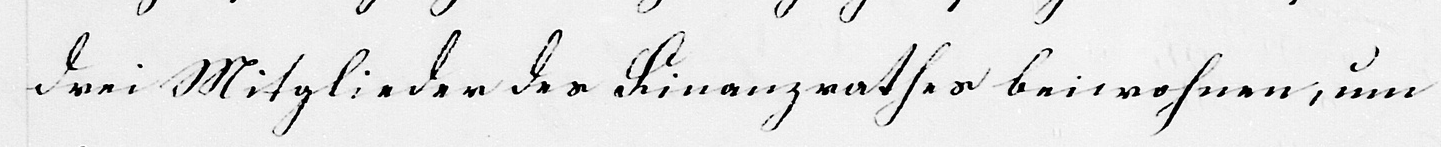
drei Mitglieder des Finanzrathes beiwohnen, um
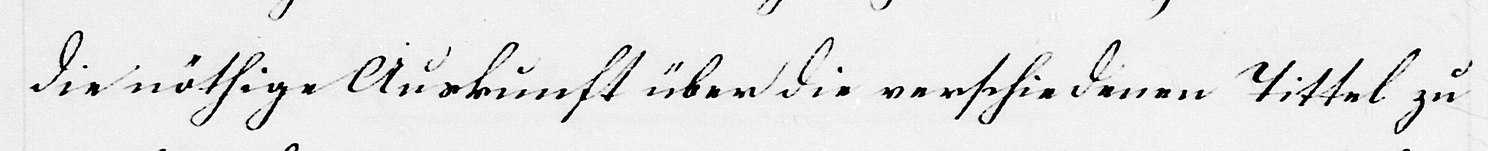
die nöthige Auskunft über die verschiedenen Tittel zu
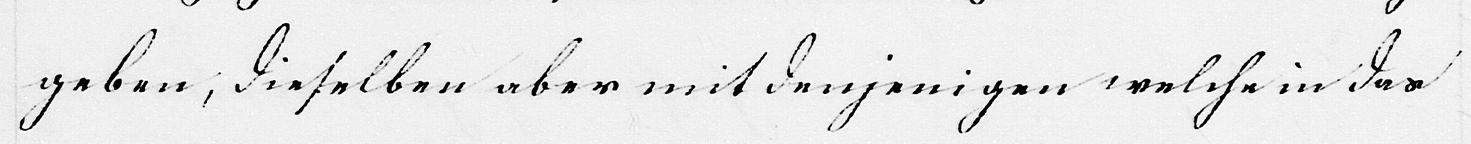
geben, dieselben aber mit denjenigen welche in das
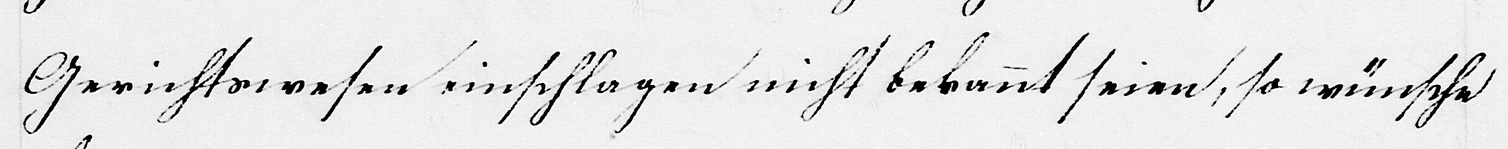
Gerichtswesen einschlagen nicht bekannt seien, so wünsche
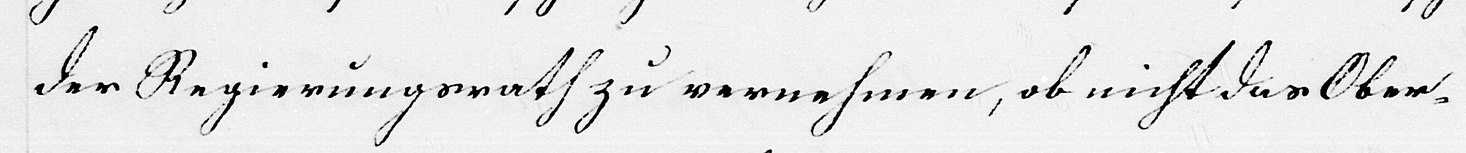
der Regierungsrath zu vernehmen, ob nicht das Ober¬
